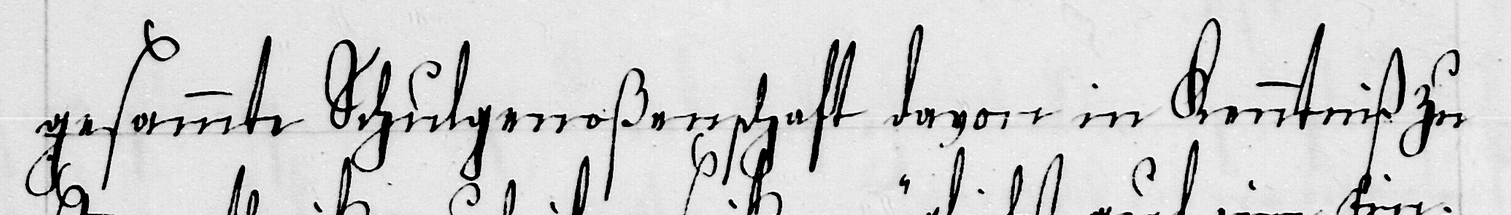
gesammte Schulgenoßenschaft davon in Kenntniß zu
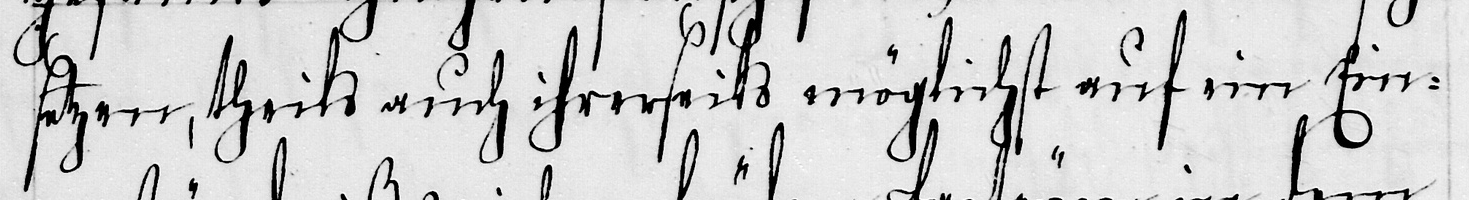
setzen, theils auch ihrerseits möglichst auf ein Ein¬
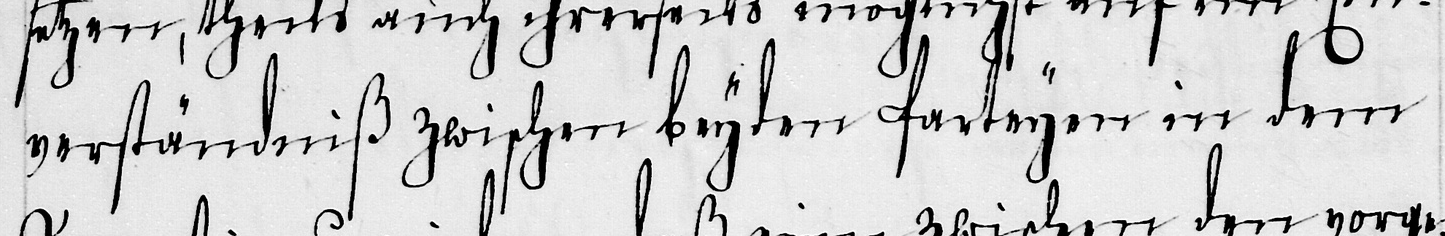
verständniß zwischen beyden Parteyen in dem
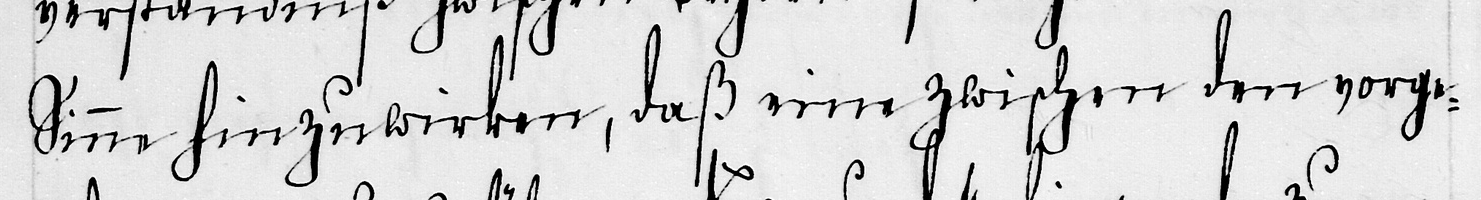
Sinne hinzuwirken, daß eine zwischen den vorge¬
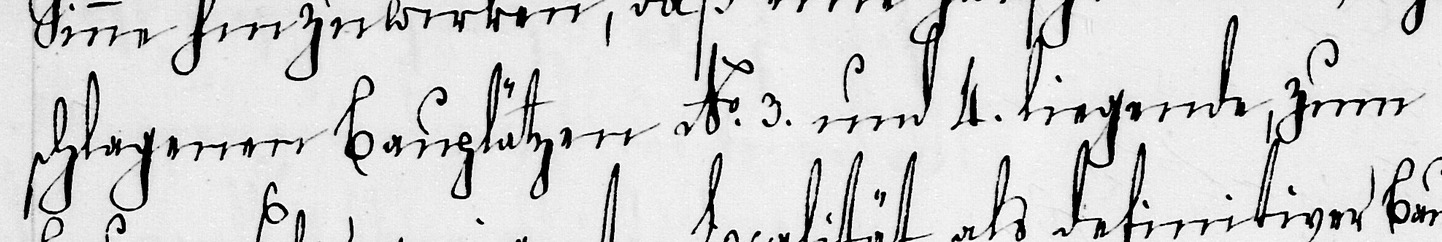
schlagenen Bauplätzen No. 3. und 4. liegende, zum
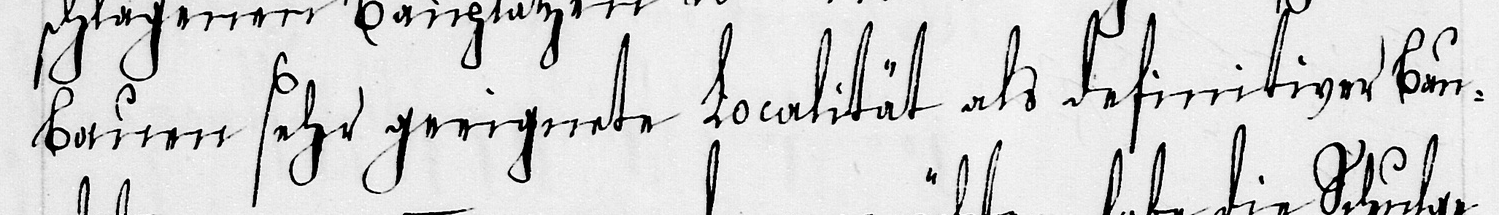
Bauen sehr geeignete Localität als definitiver Bau¬
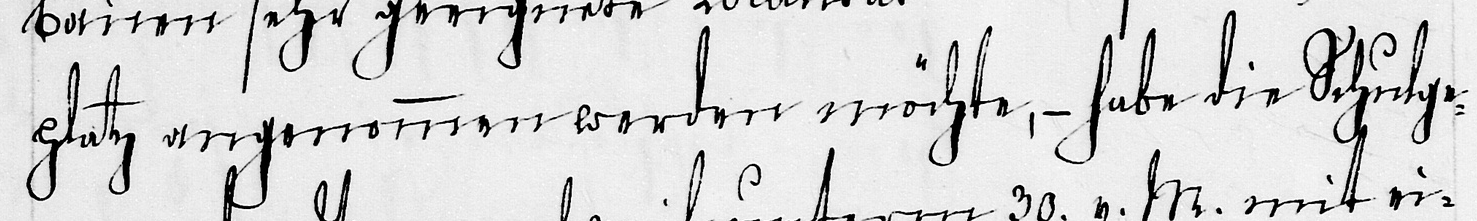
platz angenommen werden möchte, – habe die Schulge¬
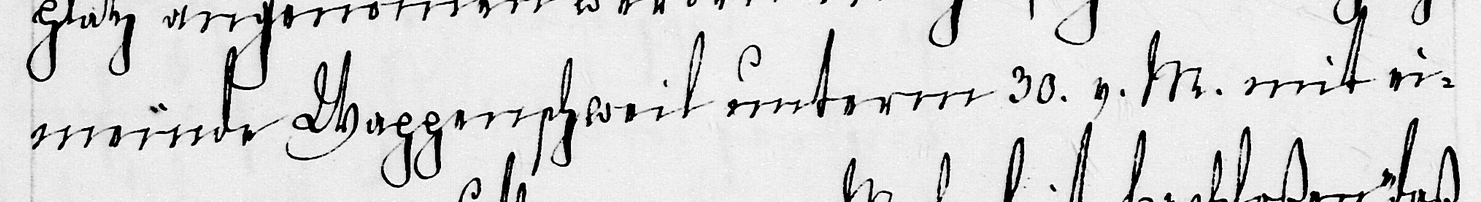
meinde Wappenschweil unterm 30. v. M. mit ei¬
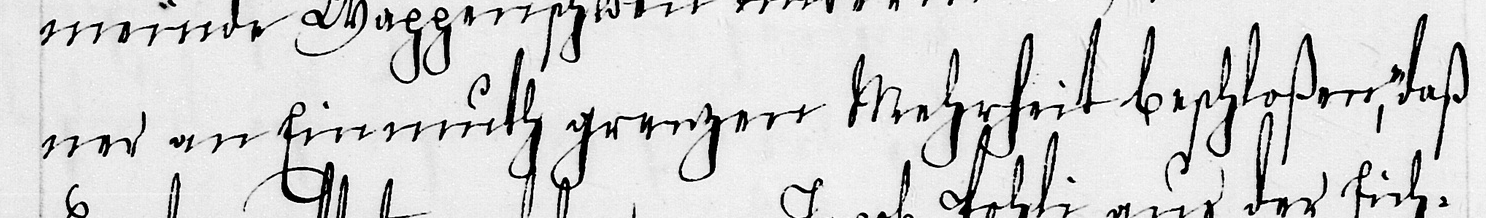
ner an Einmuth grenzen[den] Mehrheit beschloßen, „daß
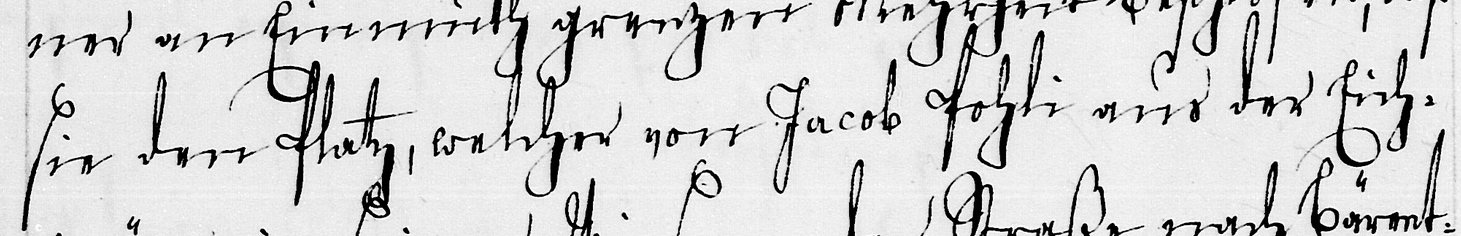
sie den Platz, welcher von Jacob Pohli aus der Eich¬
